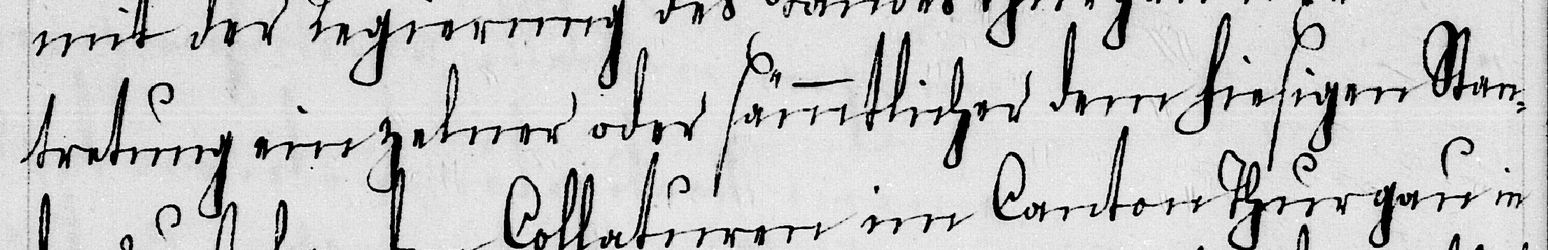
tretung einzelner oder sämmtlicher dem hiesigen Stan¬
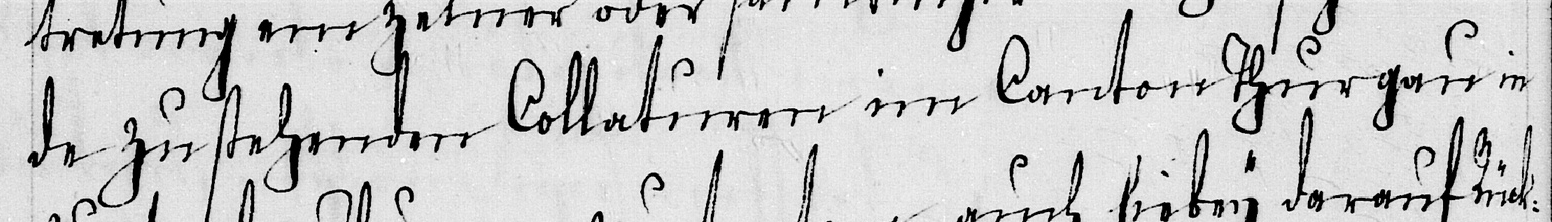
de zustehenden Collaturen im Canton Thurgau in
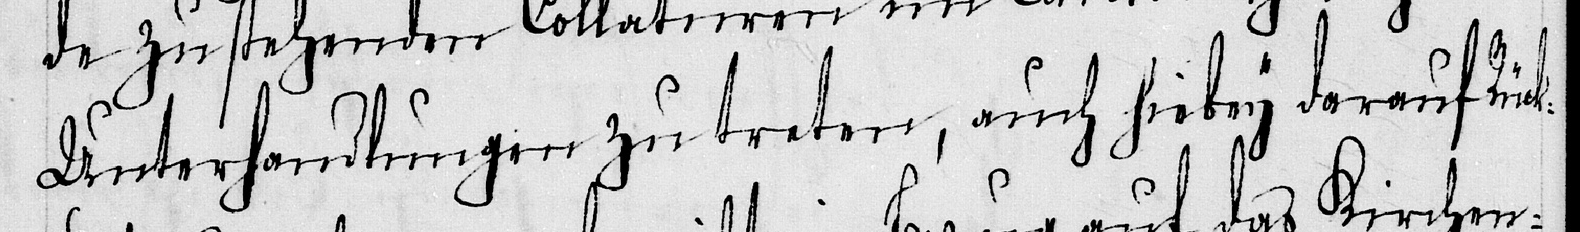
Unterhandlungen zu treten, auch hiebey darauf Rüc¬
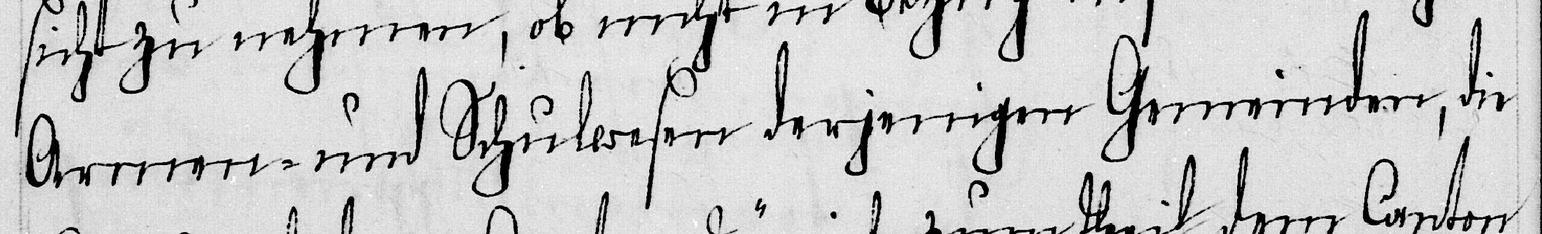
Armen und Schulwesen derjenigen Gemeinden, die
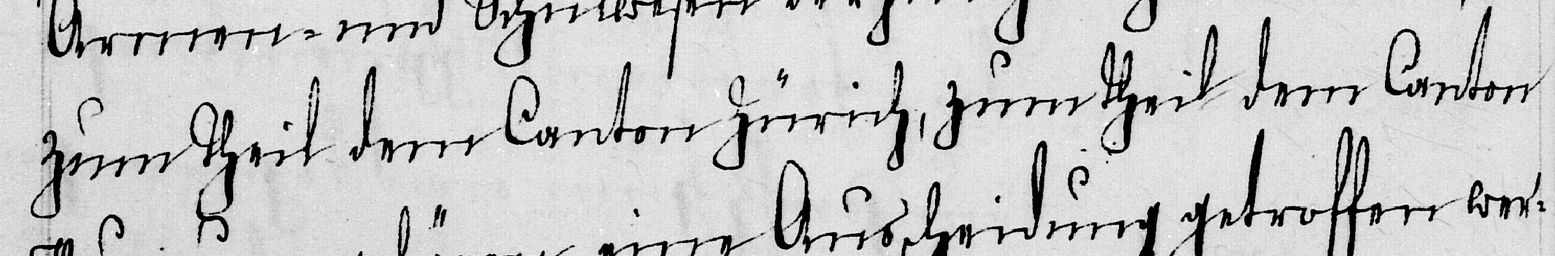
zum Theil dem Canton Zürich, zum Theil dem Canton
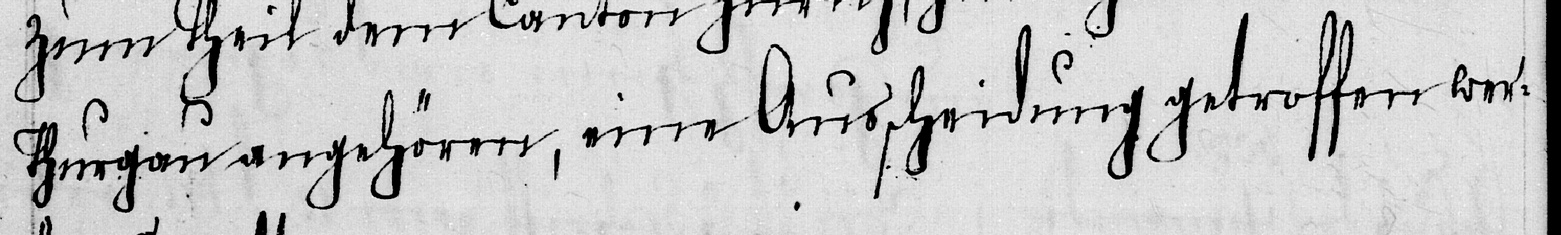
Thurgau angehören, eine Ausscheidung getroffen wer¬
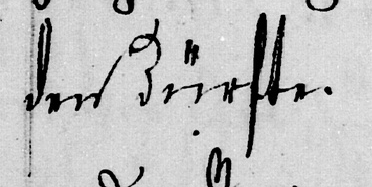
den dürfte.
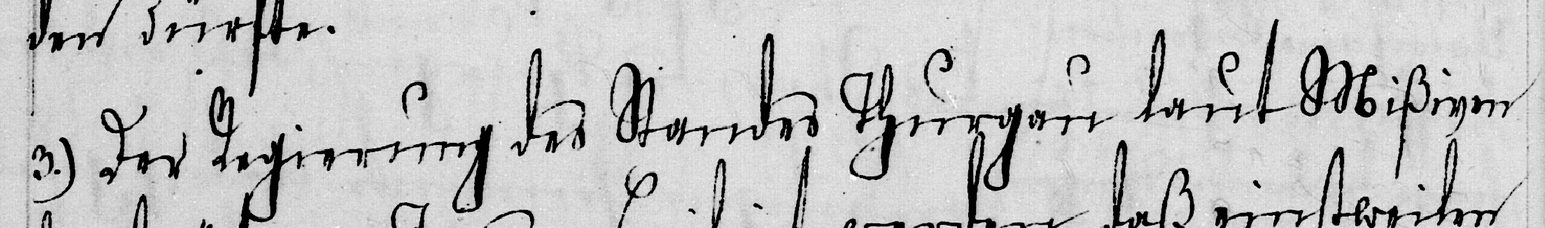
3.) Der Regierung des Standes Thurgau laut Mißiven
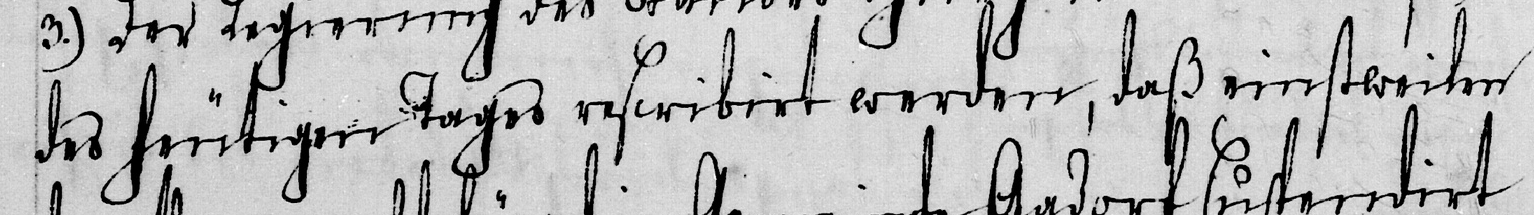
des heutigen Tages rescribiert werden, daß einstweilen
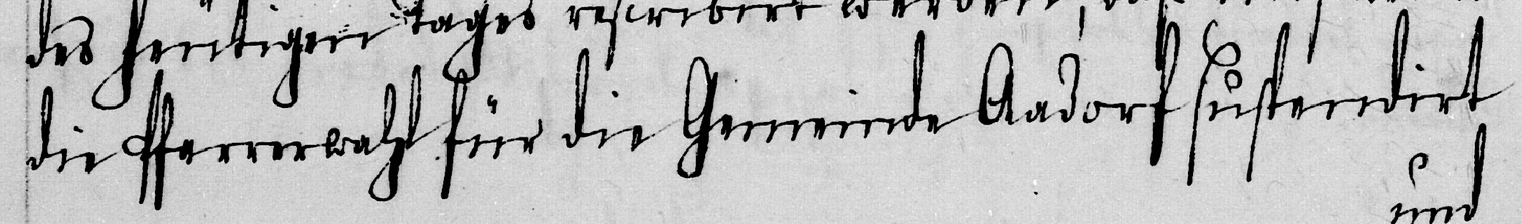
die Pfarrerwahl für die Gemeinde Aadorf suspendirt
